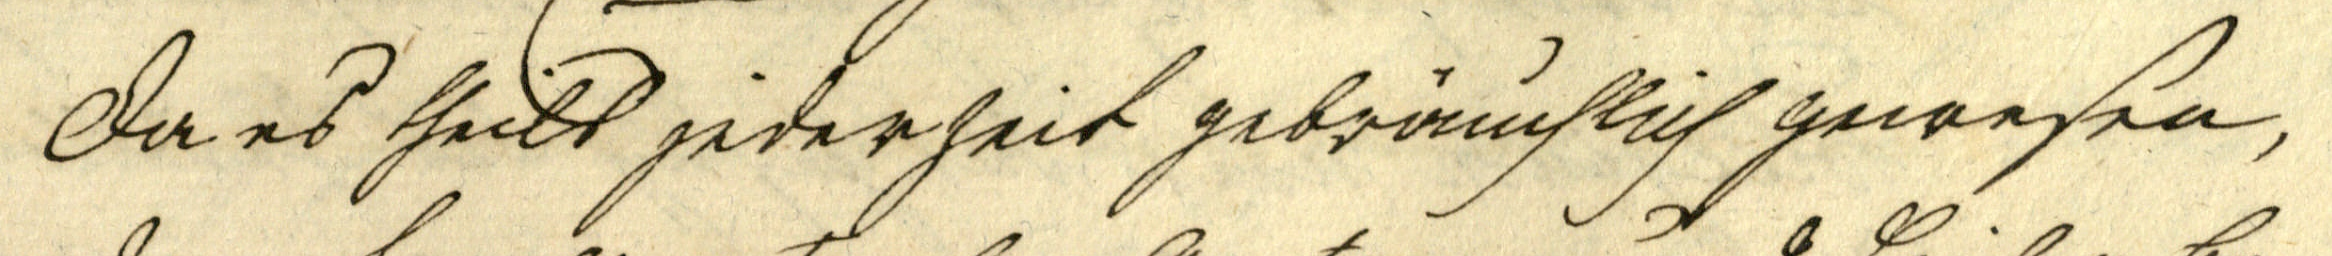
Da es theils jederzeit gebräuchlich gewesen,
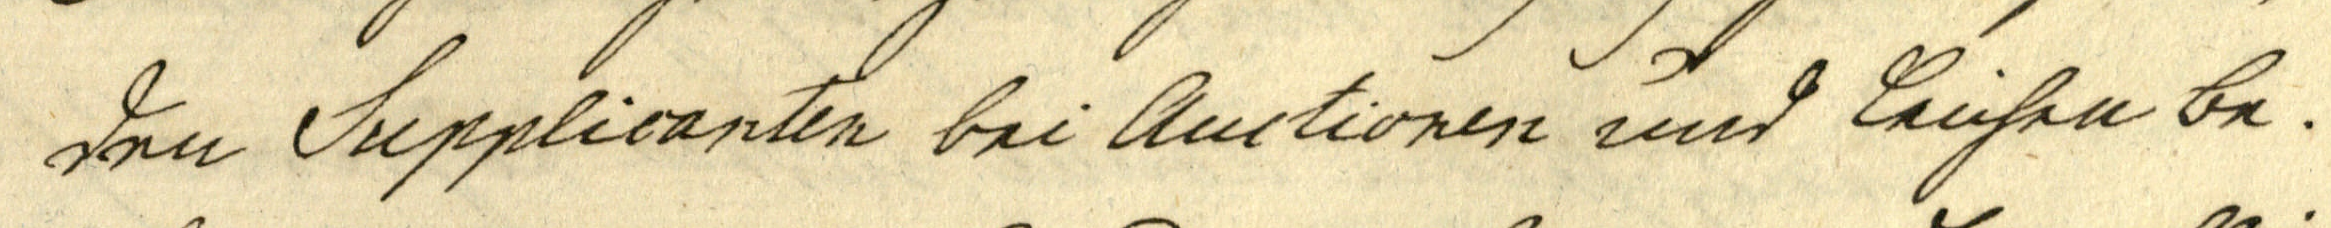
den Supplicanten bei Auctionen und Leichen Be¬
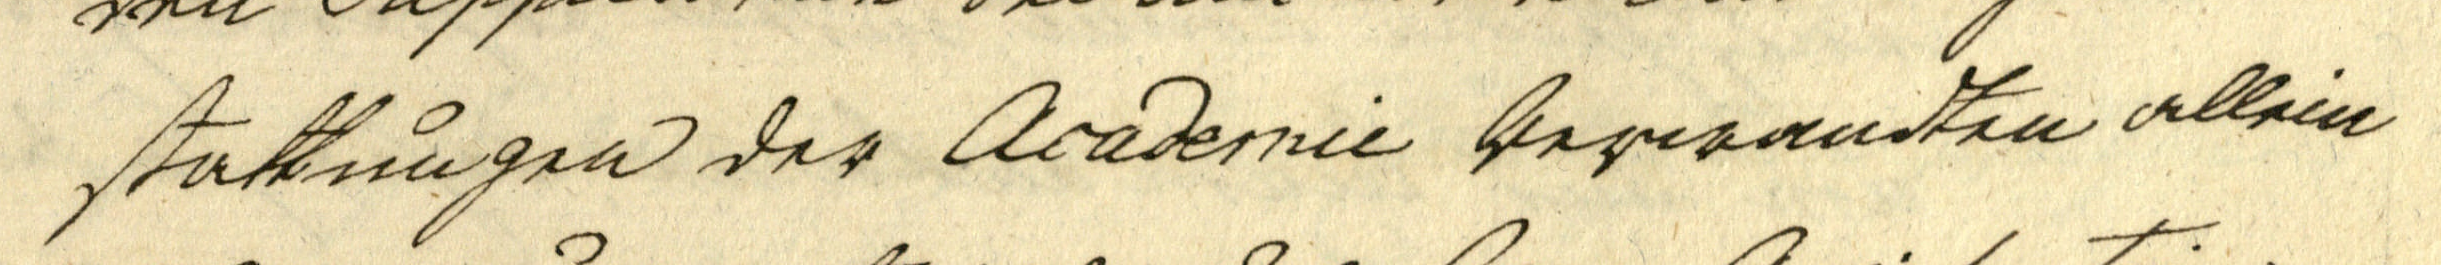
stattungen der Academie Verwandten allein
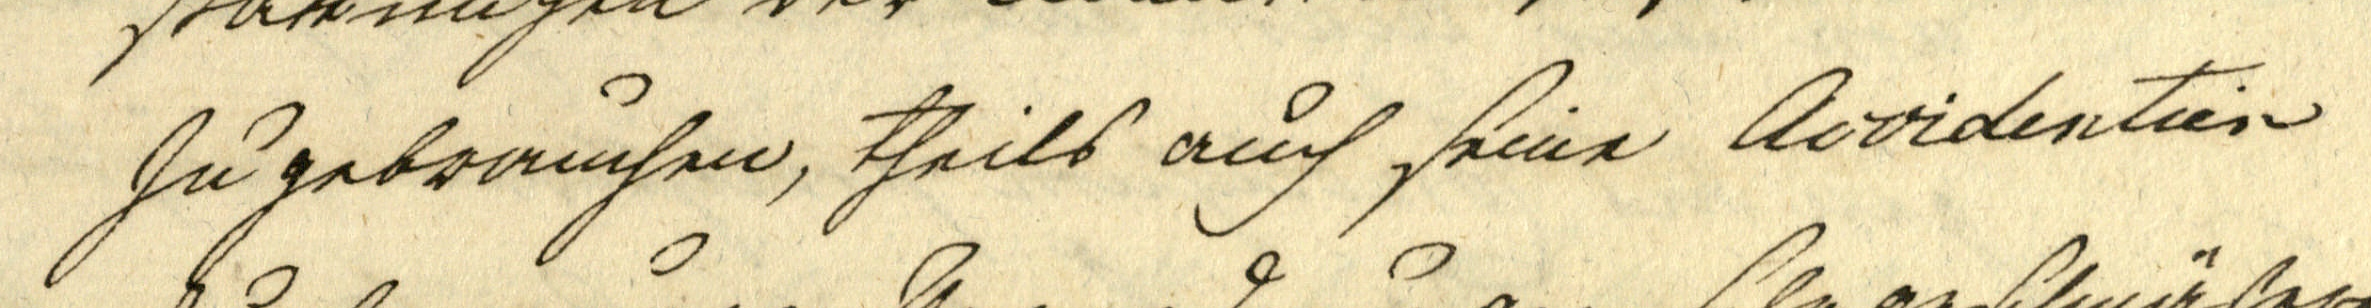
zu gebrauchen, theils auch seine Accidentien
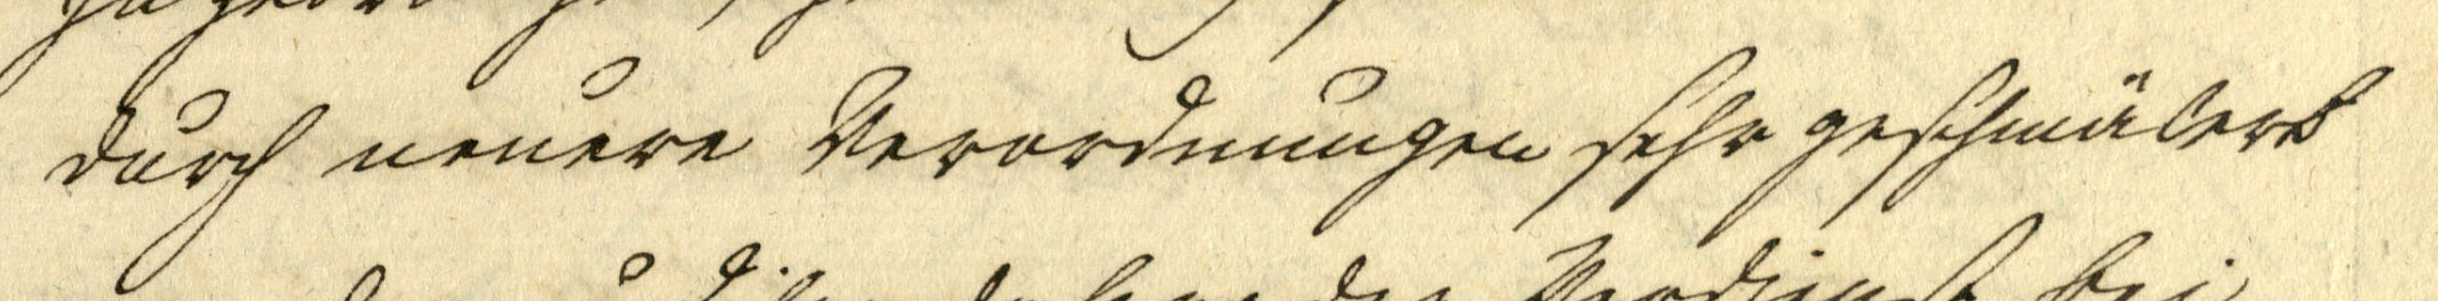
durch neuere Verordnungen sehr geschmälert
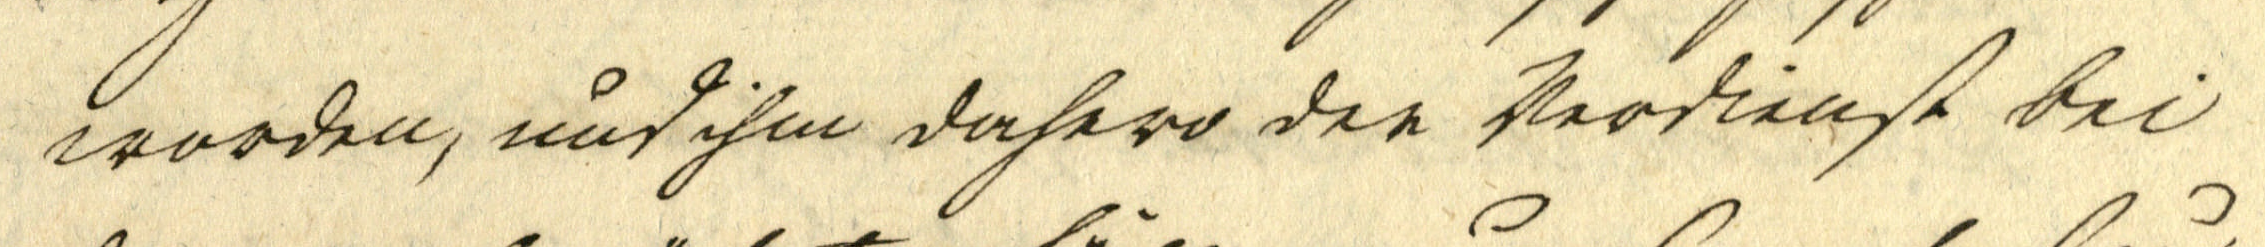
worden, und ihm dahero der Verdienst bei
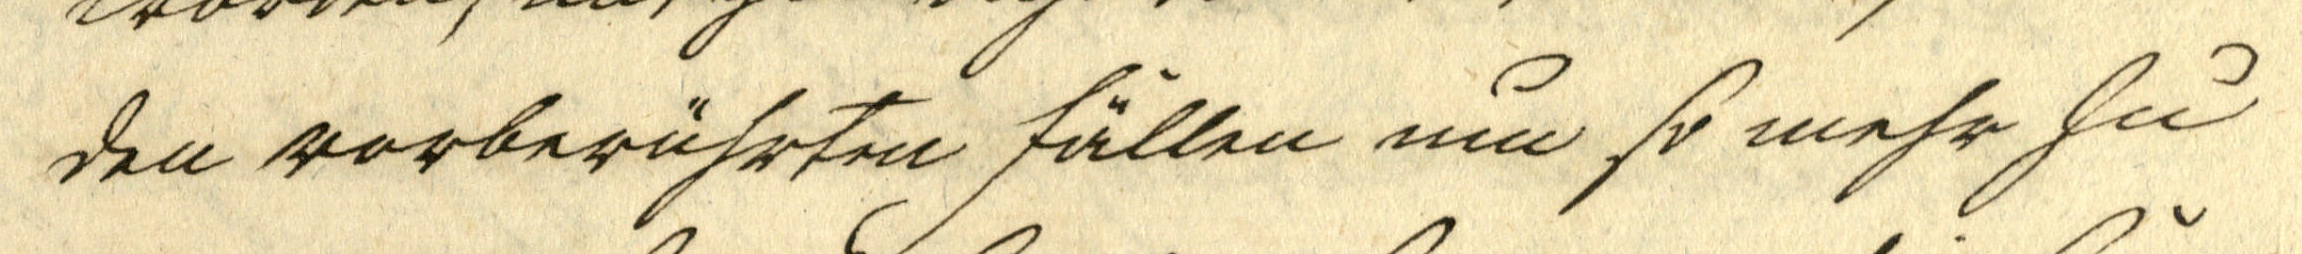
den vorberührten Fällen um so mehr zu
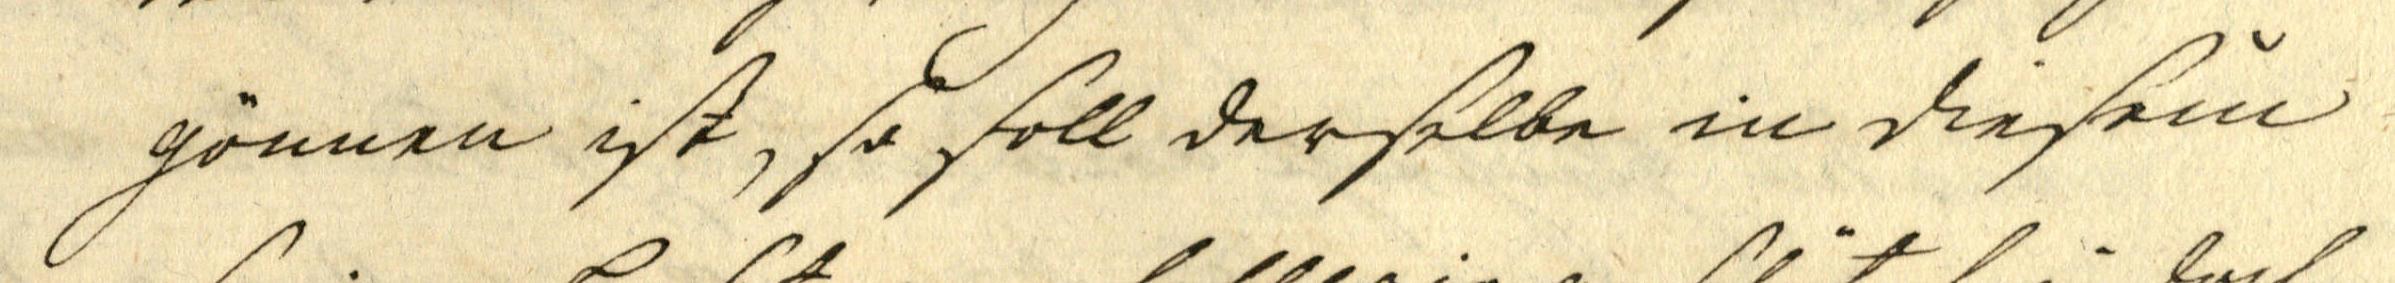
gönnen ist, so soll derselbe in diesem
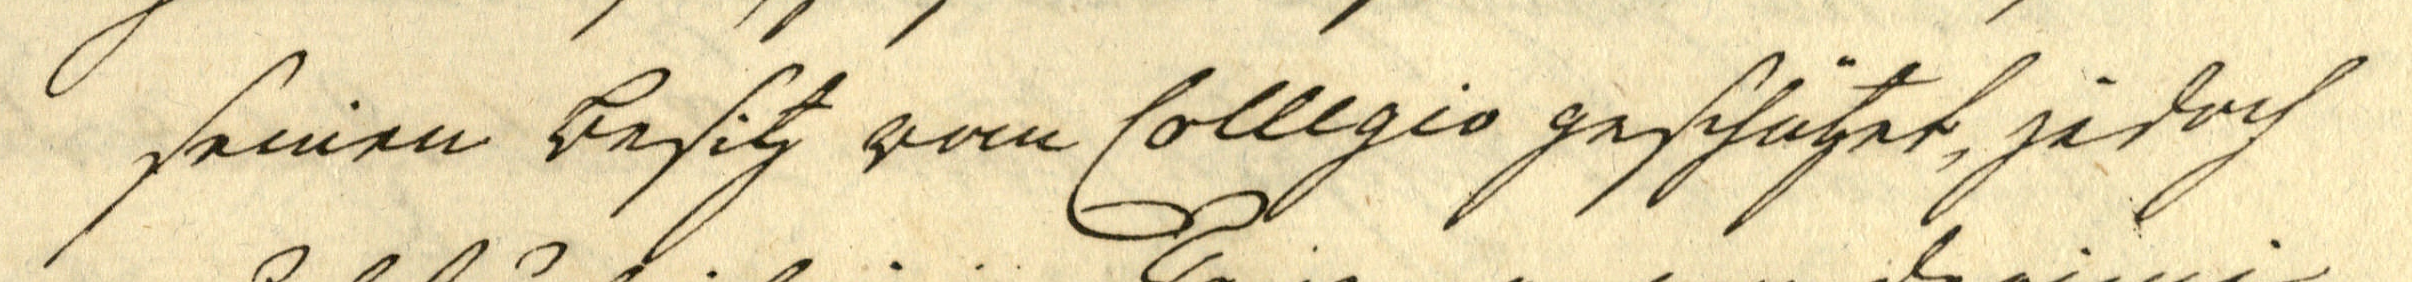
seinen Besitz vom Collegio geschützet, jedoch
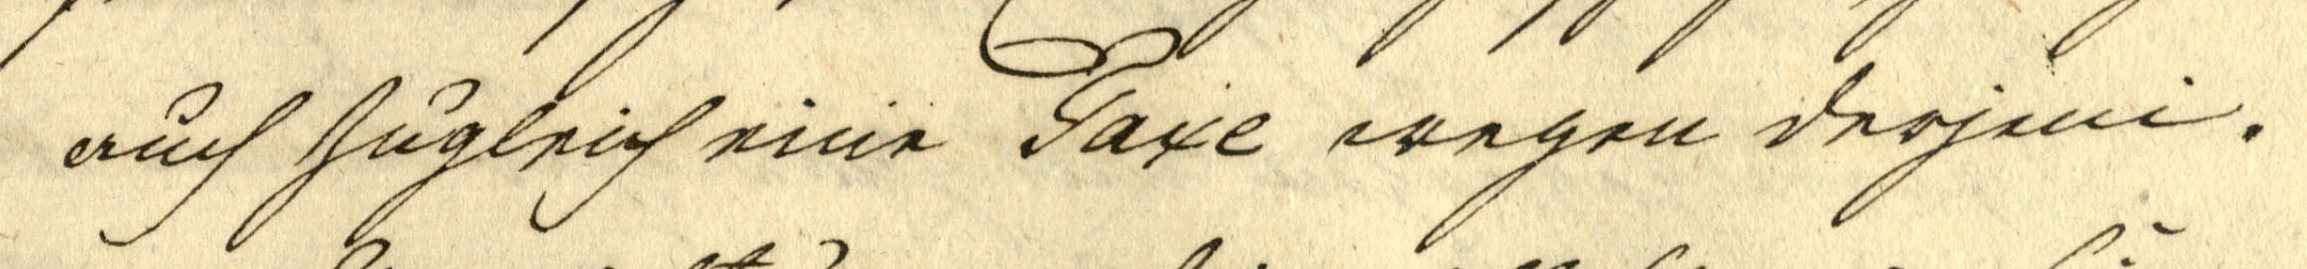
auch zugleich eine Taxe wegen derjeni¬
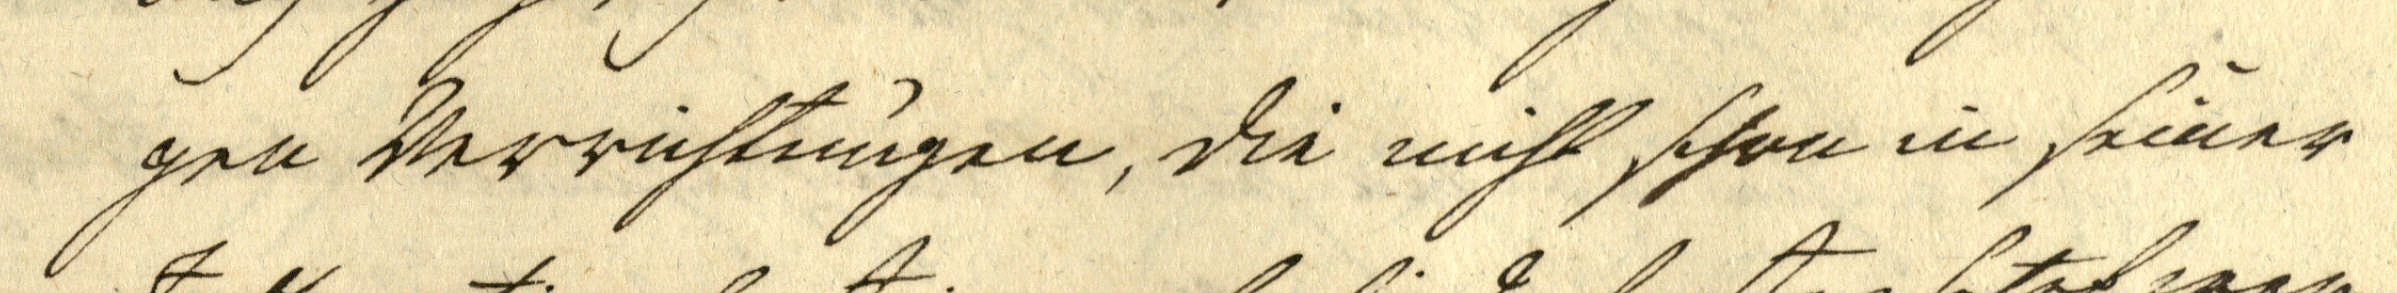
gen Verrichtungen, die nicht schon in seiner
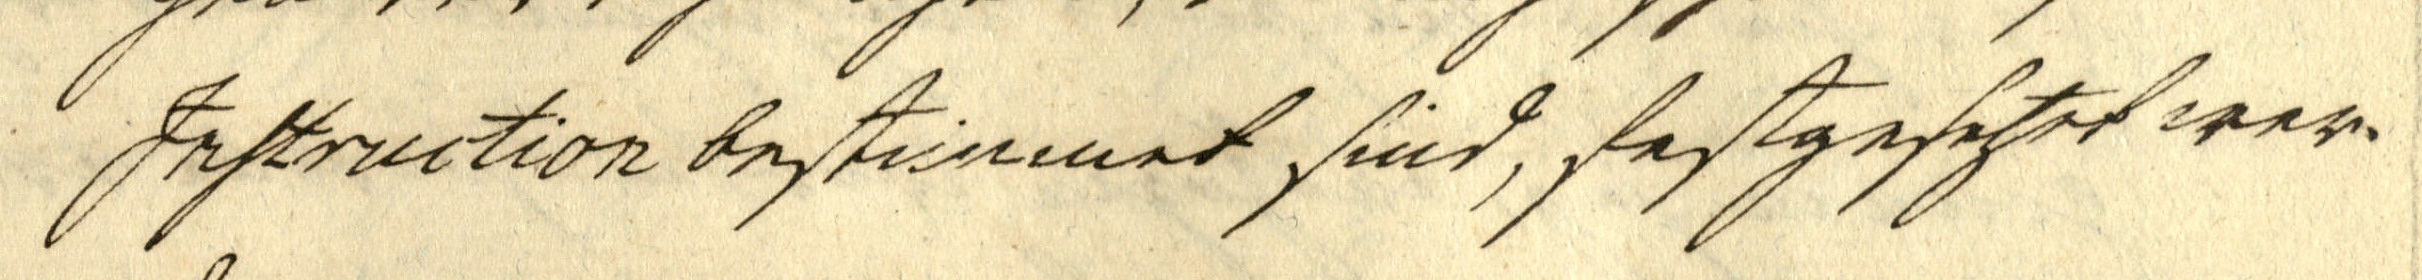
Instruction bestimmet sind, festgesetzet wer¬
